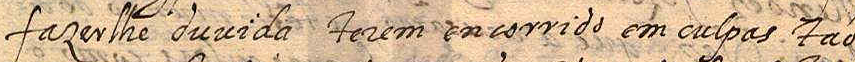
fazerlhe duuida terem encorrido em culpas taõ
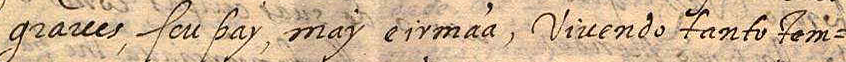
graues, seu pay, may e irmaā, Viuendo tanto tem
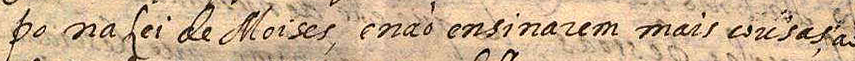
po na Lei de Moises, e naõ ensinarem mais cousas, ao
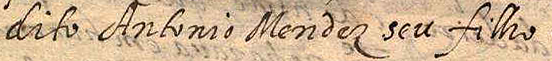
dito Antonio Mendez seu filho.
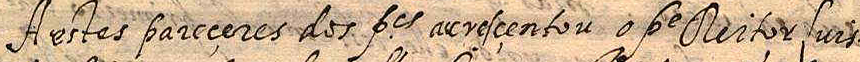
A estes pareçeres dos p.es accresçentou o pe Reitor Luis
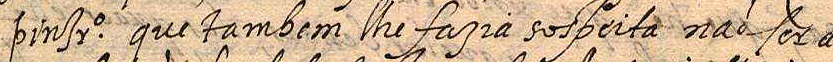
pinhro. que tambem lhe fazia sospeita naõ ser a
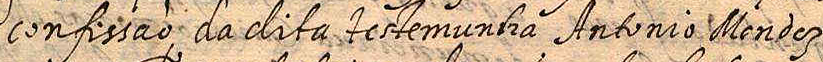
confissaõ da dita testemunha Antonio Mendez
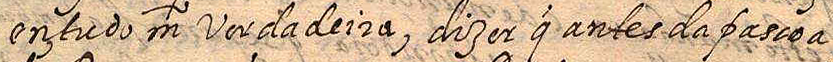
en tudo mto Verdadeira, dizer q̄ antes da pascoa
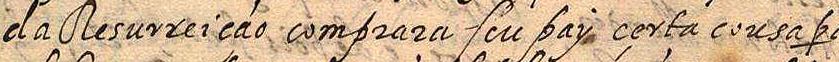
da Resurreição comprara seu pay çerta cousa ꝑa
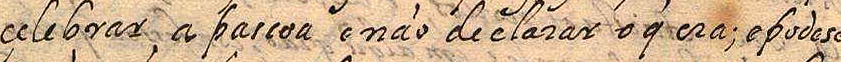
çelebrar a pascoa e não declarar o q̄ era; e podese
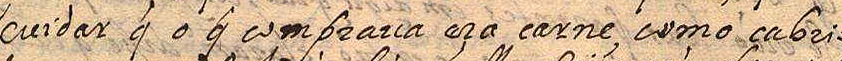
cuidar q̄ o q̄ compraua era carne, como cabri
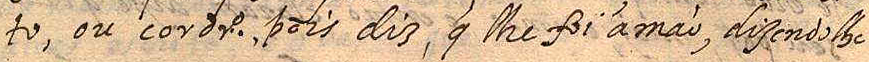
to, ou cordro., pois diz, q̄ lhe foi a maõ, dizendolhe
